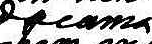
da cama
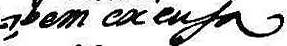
bem excusa
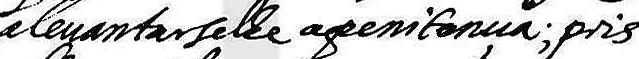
aleuantar se lhe a penitençia; pois
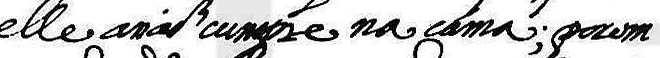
elle a naõ cumpre na cama; porem
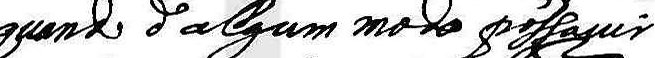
quando de algum modo possa uir
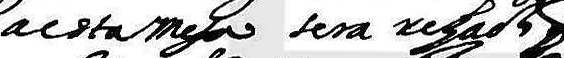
a esta mesa sera rezaõ q̄
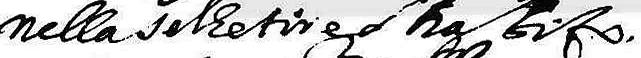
nella se lhe tire o habito.
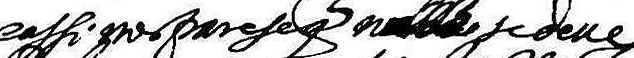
e assi nos parese q̄ naõ se deve
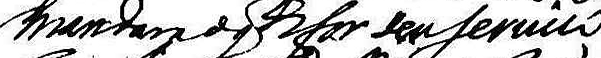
mandara o q̄ for seu seruiço
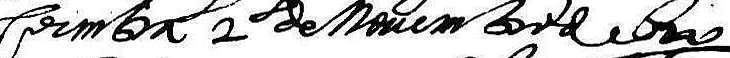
Coimbra 2 de Novembro de 620
